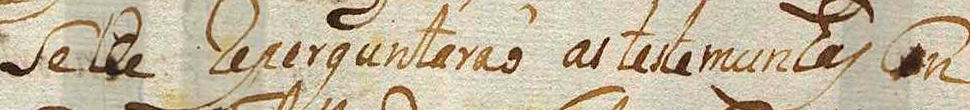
Se lhe Reperguntarão as testemunhas Con
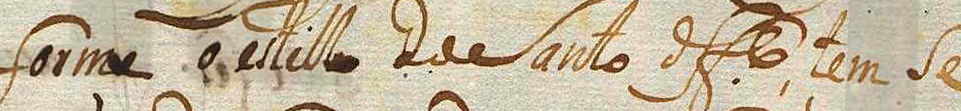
forme o estillo do Santo Off.co, tem Se
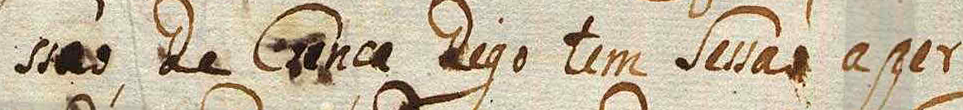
ssão, de Crença digo tem Sessaõ aper
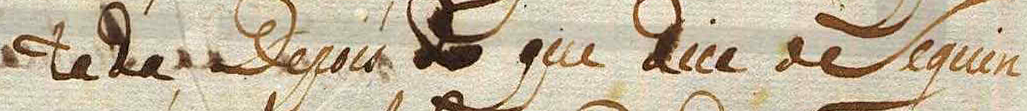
tada, Depois do que dice o Seguin
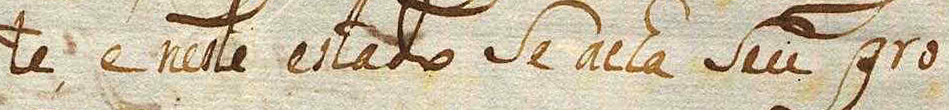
te e neste estado Se acha seu pro
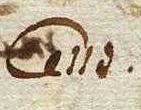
Cesso.
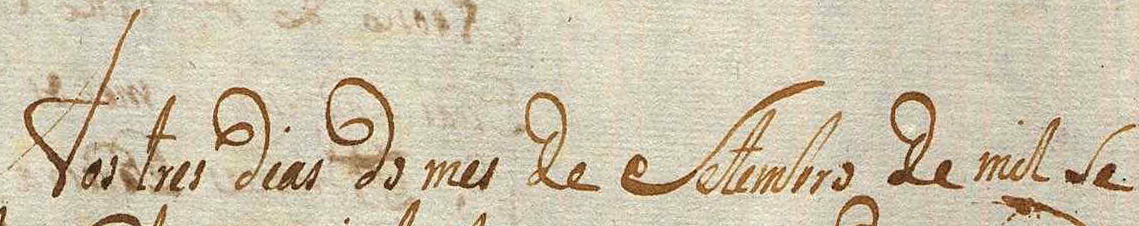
Aos tres dias do mes de Setembro de mil se
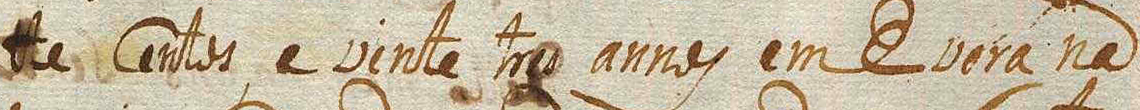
ttecentos, e vinte tres annos em Evora na
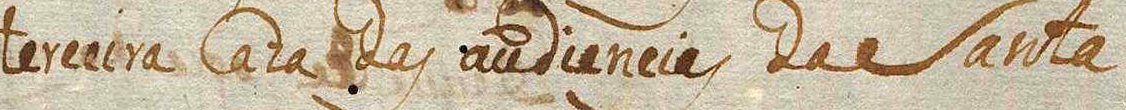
terceira Caza das audiencias da Santa
